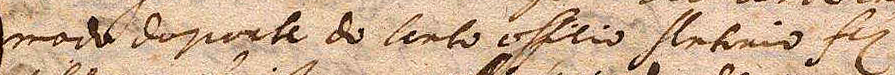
mado da parte do santo officio Antonio frz̄
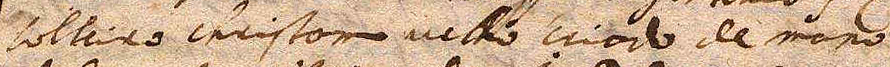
solteiro christam uelho criado de mano
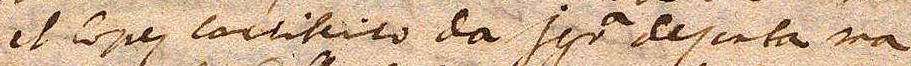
el lopes carrileiro da Jgra de santa ma
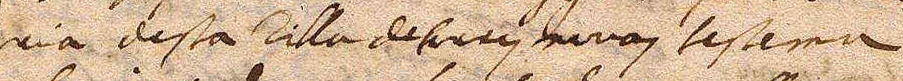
ria desta Villa de torres nouas testemu
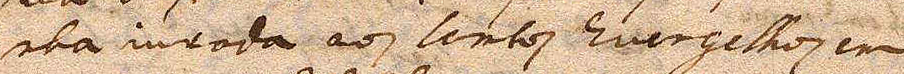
nha iurada aos santos Euangelhos em
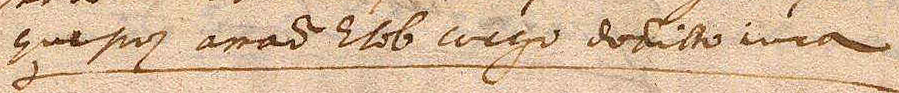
que pos a maõ E sob cargo do ditto iura
